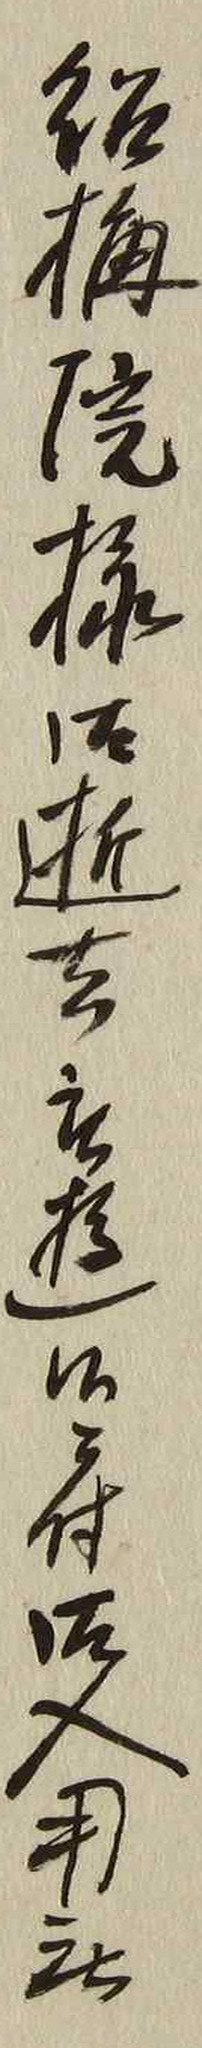紹栴院様御逝去被遊候ニ付御入用無
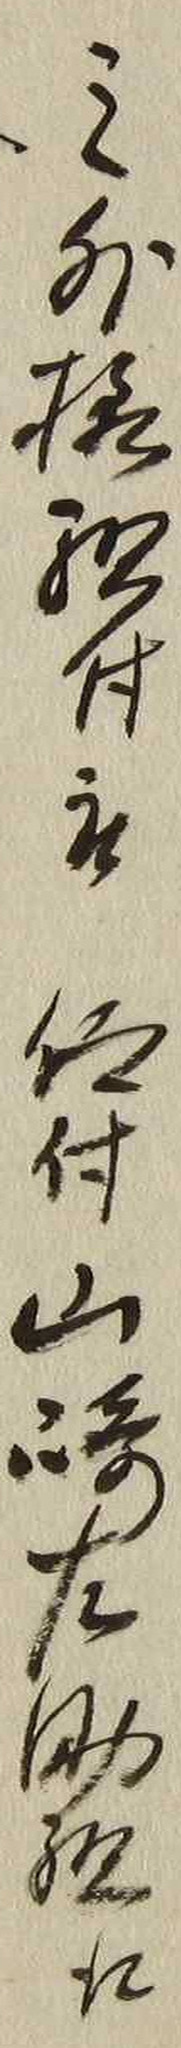之外様組付被仰付山崎左助組江
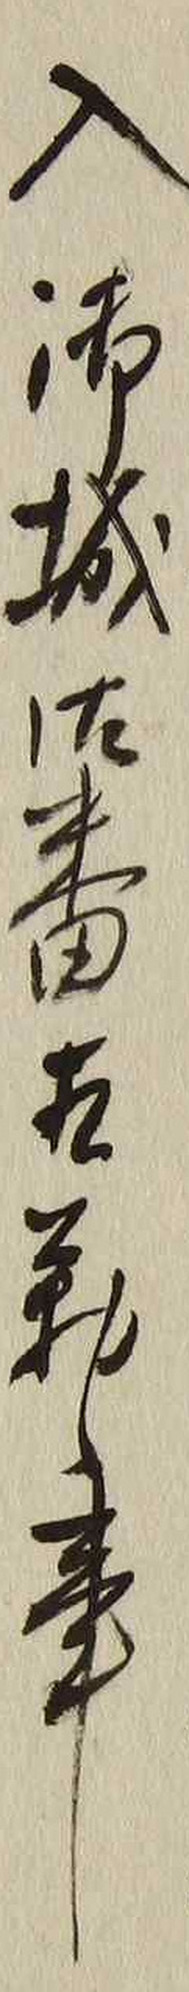入御城御番相勤候事
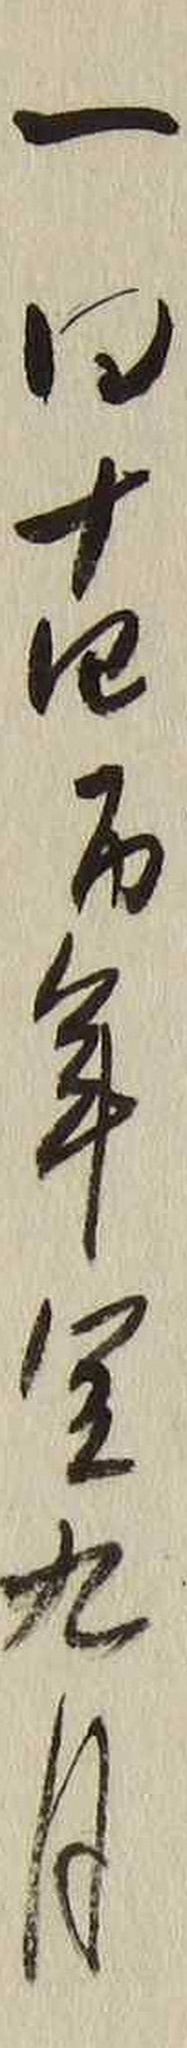一同十四酉年閏九月
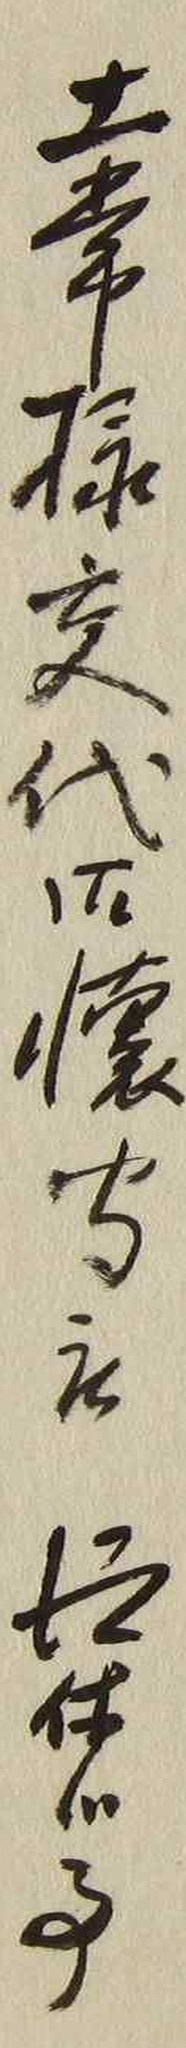土常様交代御懐守被仰付候事
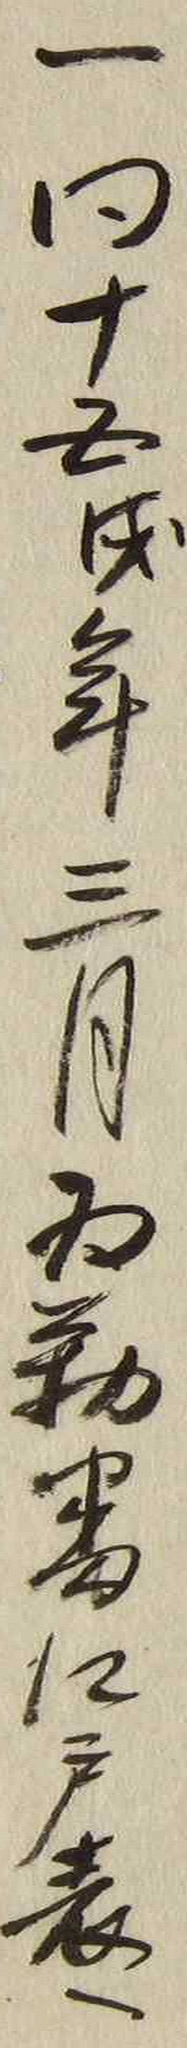一同十五戌年三月為勤番江戸表へ
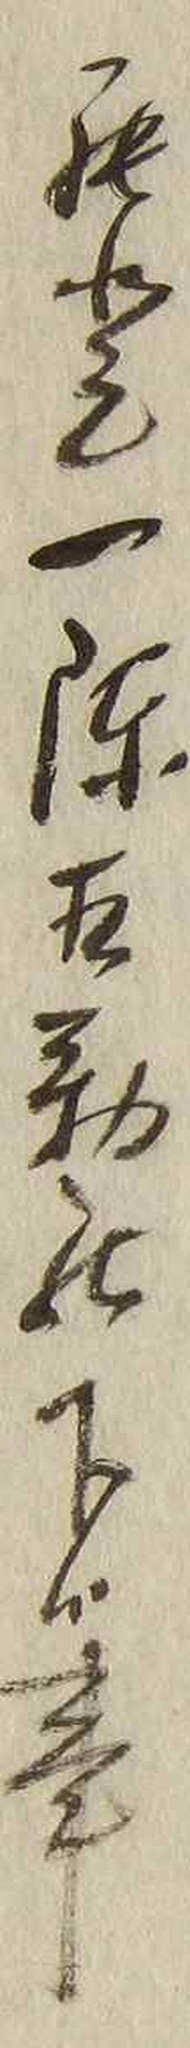罷登一陣相勤罷下候事

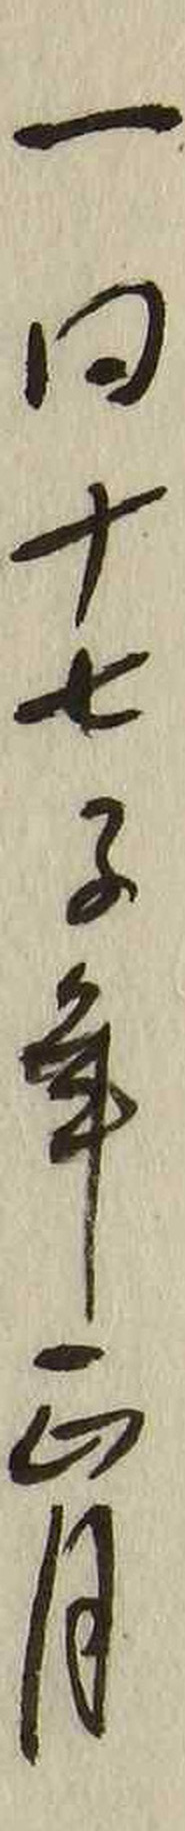一同十七子年正月
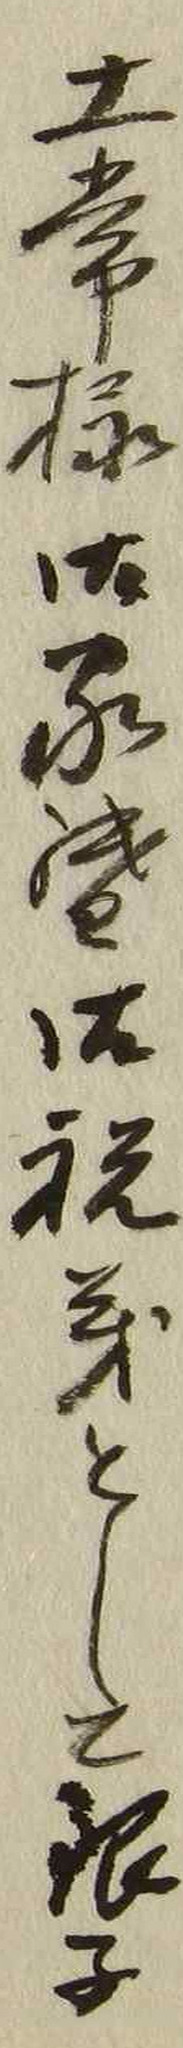土常様御家督御祝義として銀子
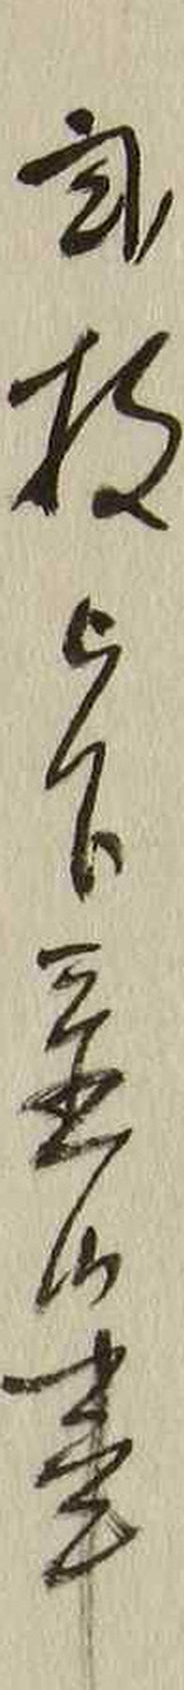弐枚被下置候事
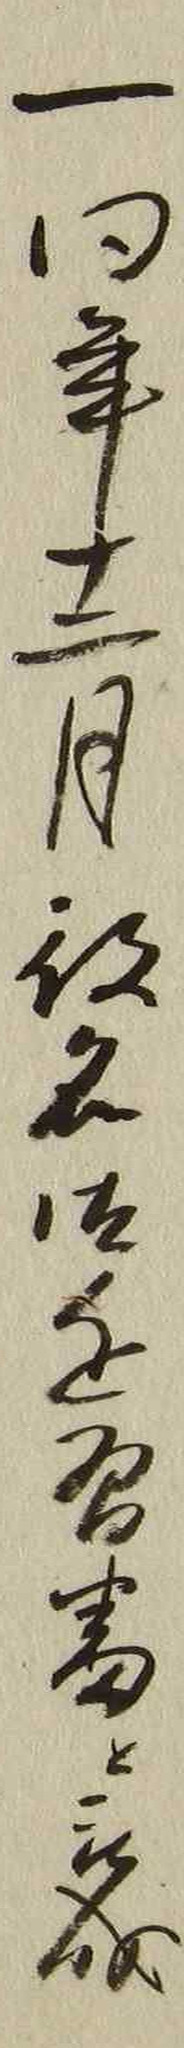一同年十二月役名御近習番と被成
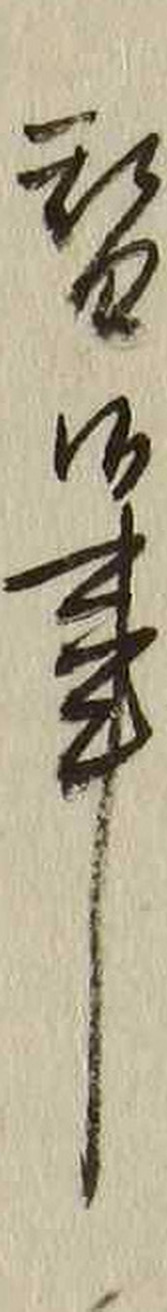替候事
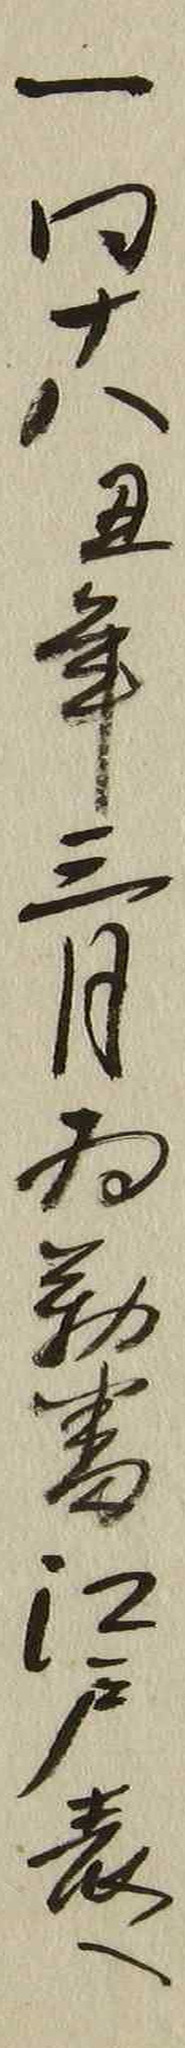一同十八丑年三月為勤番江戸表へ
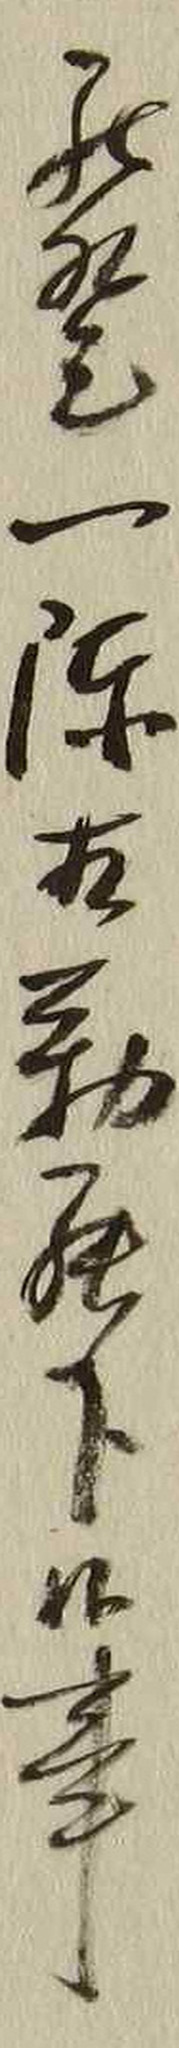罷登一陣相勤罷下候事
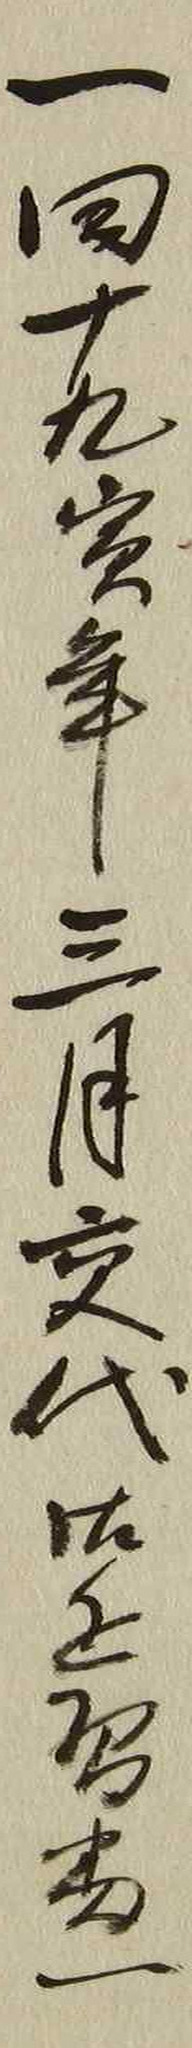一同十九寅年三月交代御近習番一
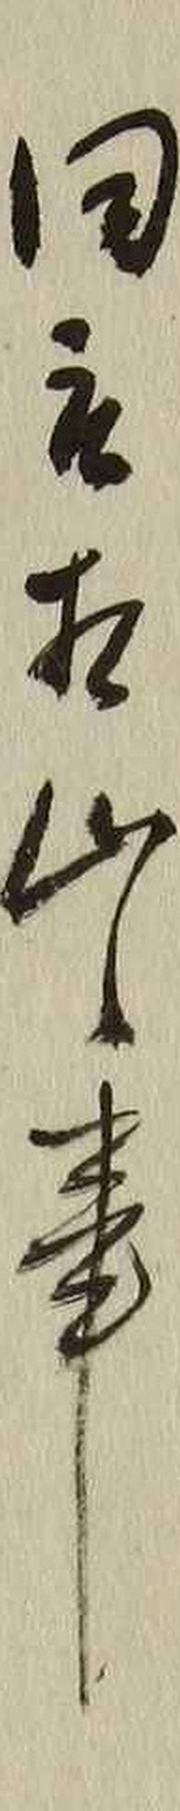同被相止候事
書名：諸士系譜　巻之359　す之部9
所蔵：会津若松市立会津図書館
